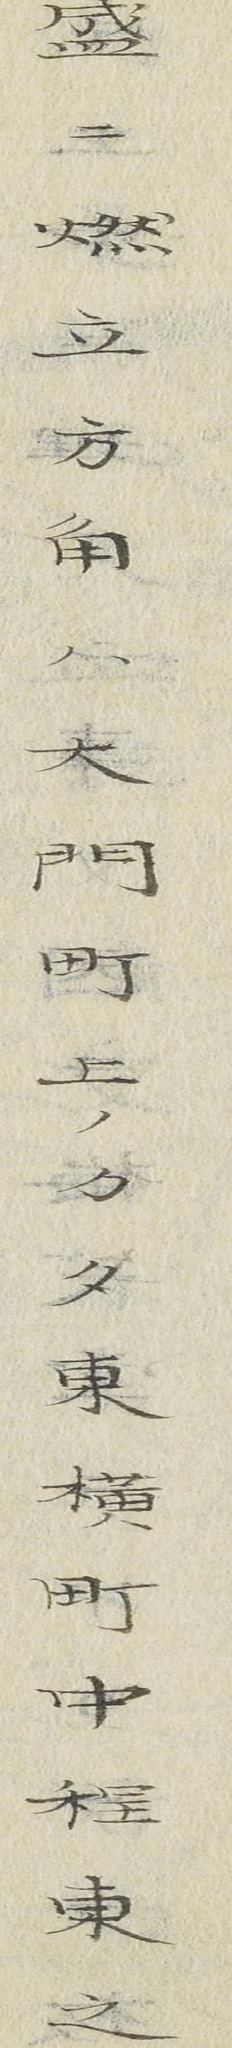盛ニ燃立方角ハ大門町上ノカタ東横町中程東之
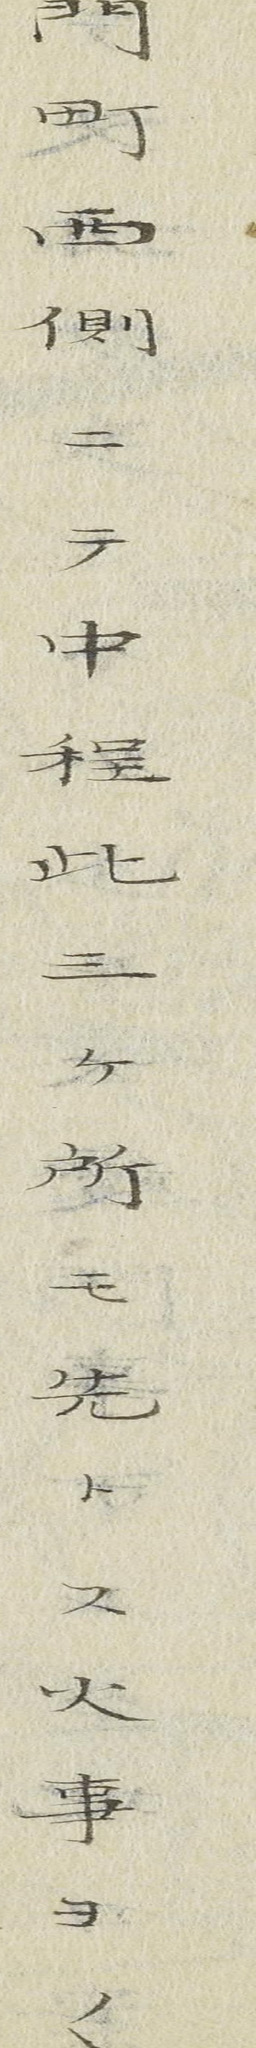門町西側ニテ中程此三ヶ所モ先トス火事ヨ〱
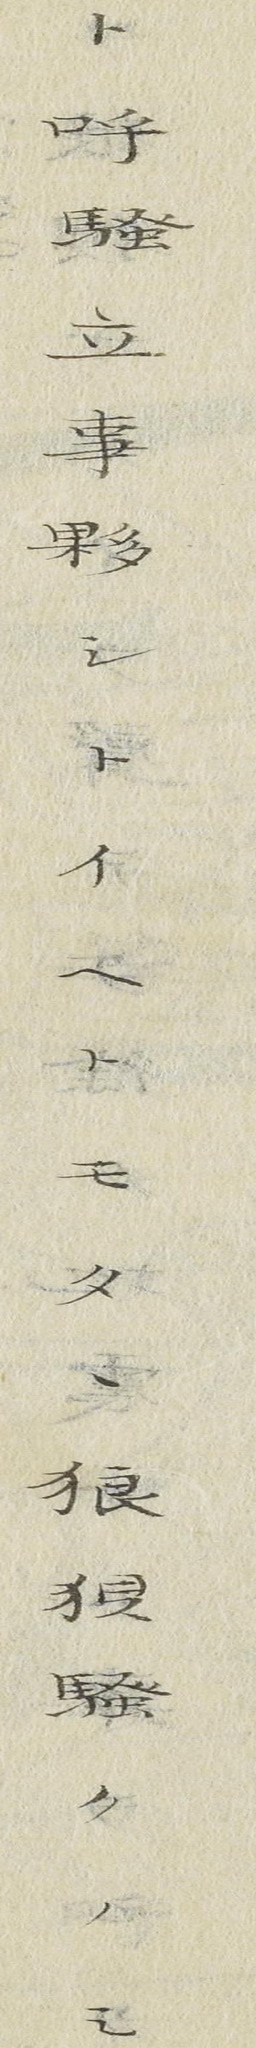ト呼騒立事夥シトイヘトモタヽ狼狽騒クノミ
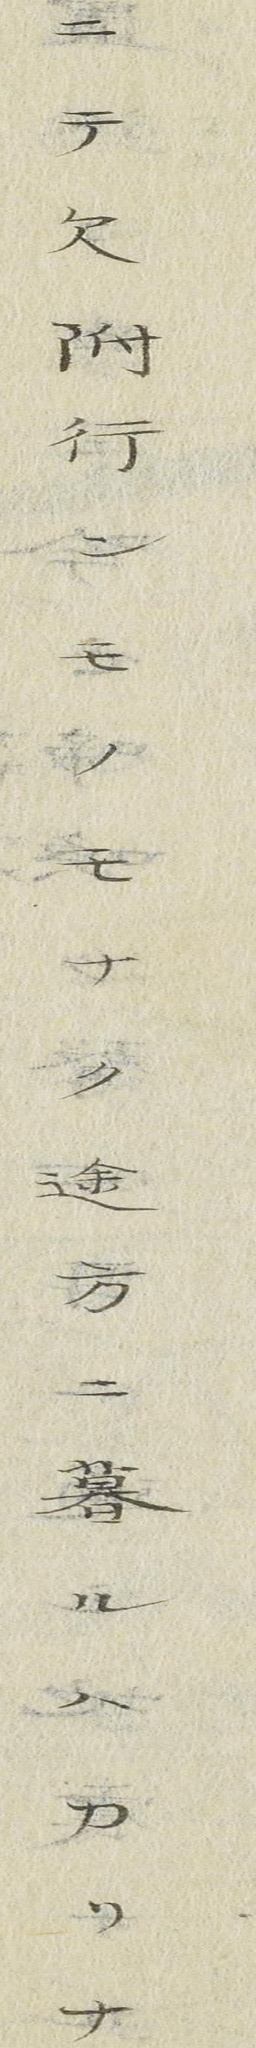ニテ欠附行ンモノモナク途方ニ暮ルハカリナ
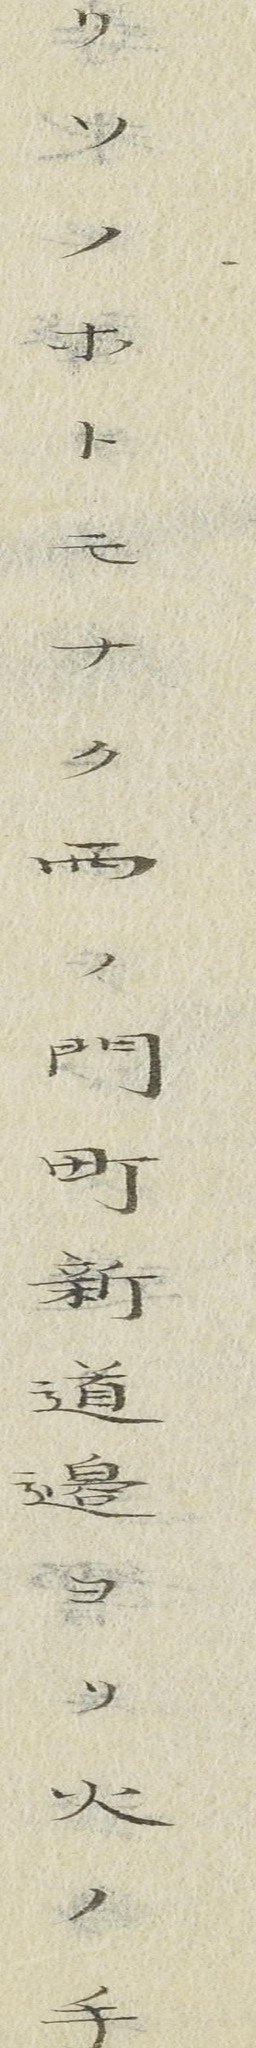リソノホトモナク西ノ門町新道辺ヨリ火ノ手
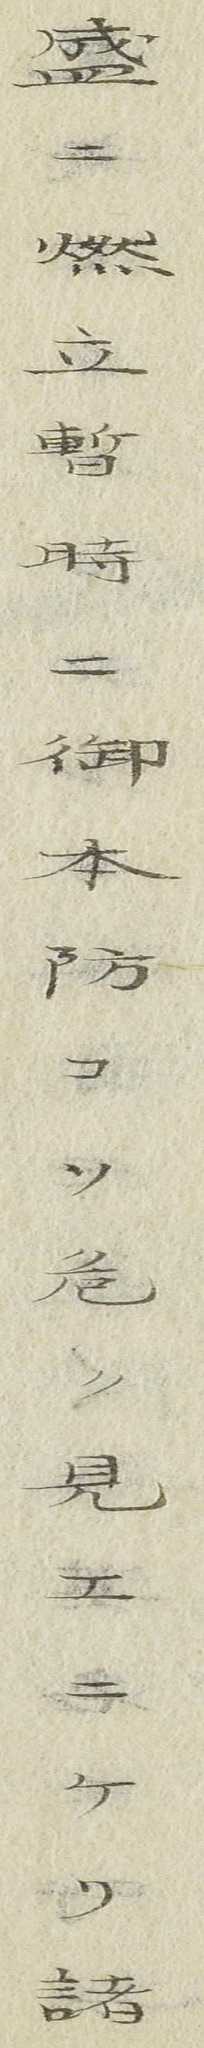盛ニ燃立暫時ニ御本防コソ危ク見エニケリ諸
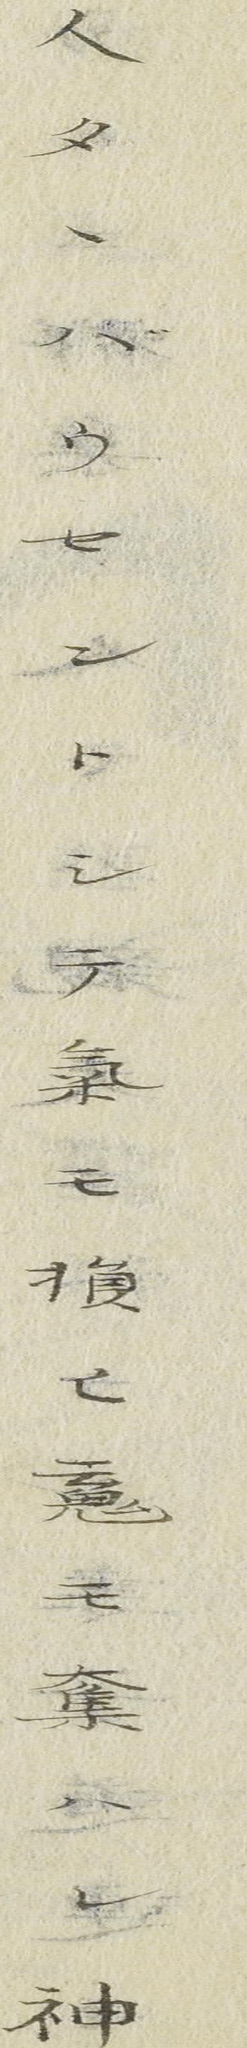人タヽハウセントシテ気モ損ヒ魂モ奪ハレ神
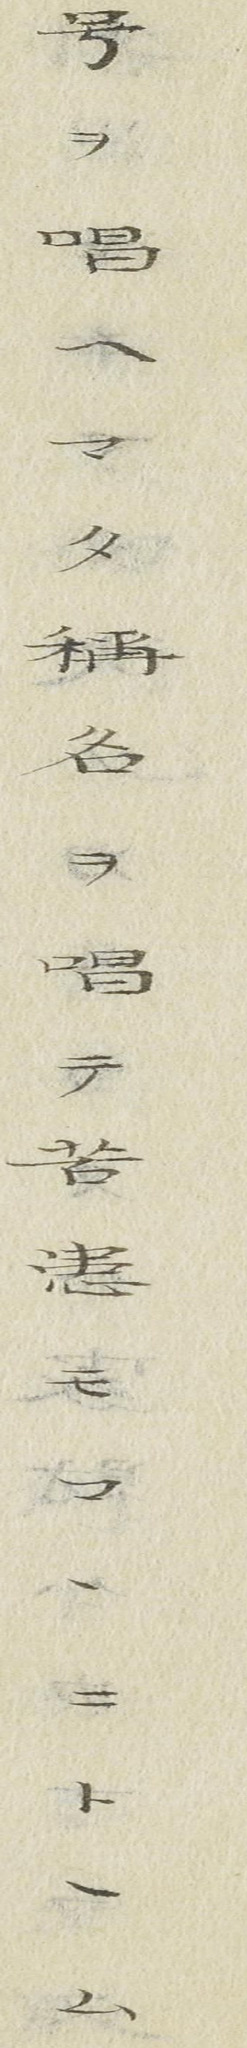号ヲ唱ヘマタ称名ヲ唱テ苦患モコヽニトヽム
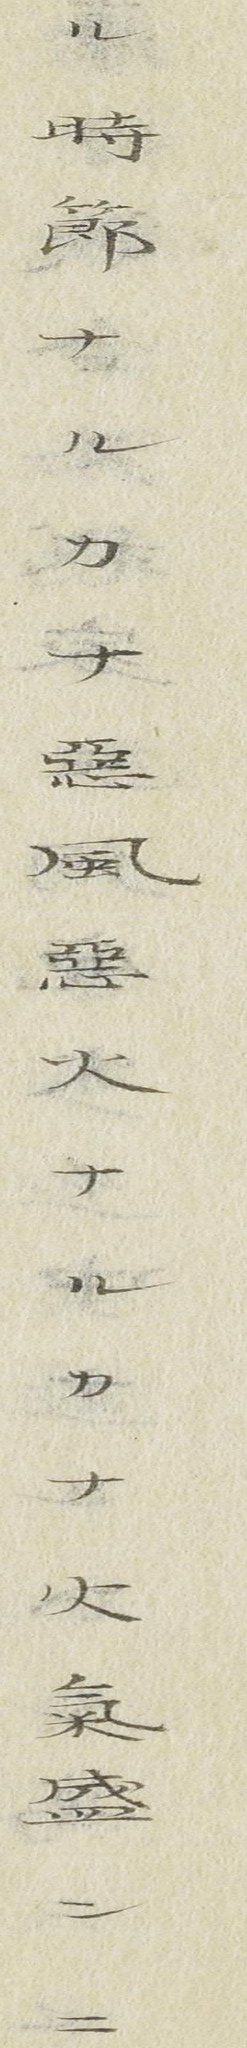ル時節ナルカナ悪風悪火ナルカナ火気盛ンニ
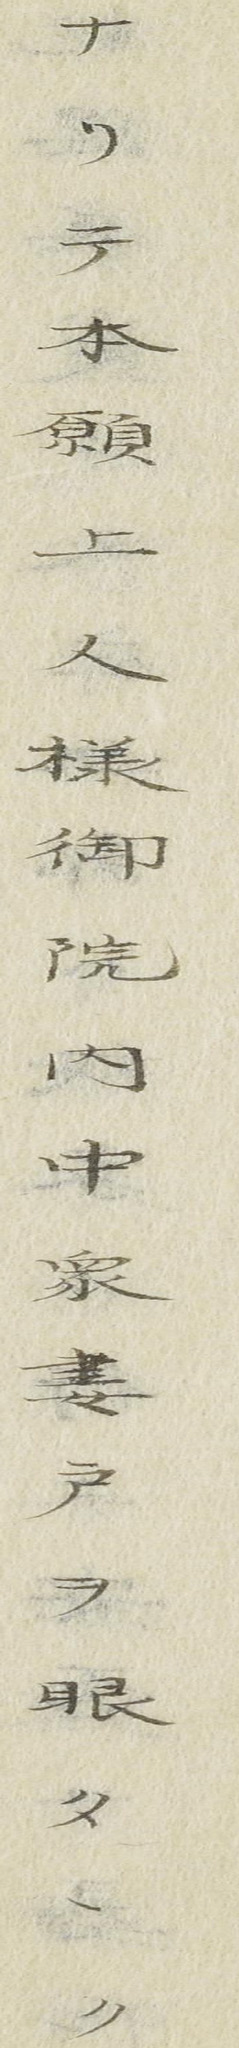ナリテ本願上人様御院内中衆妻戸ヲ眼タヽク
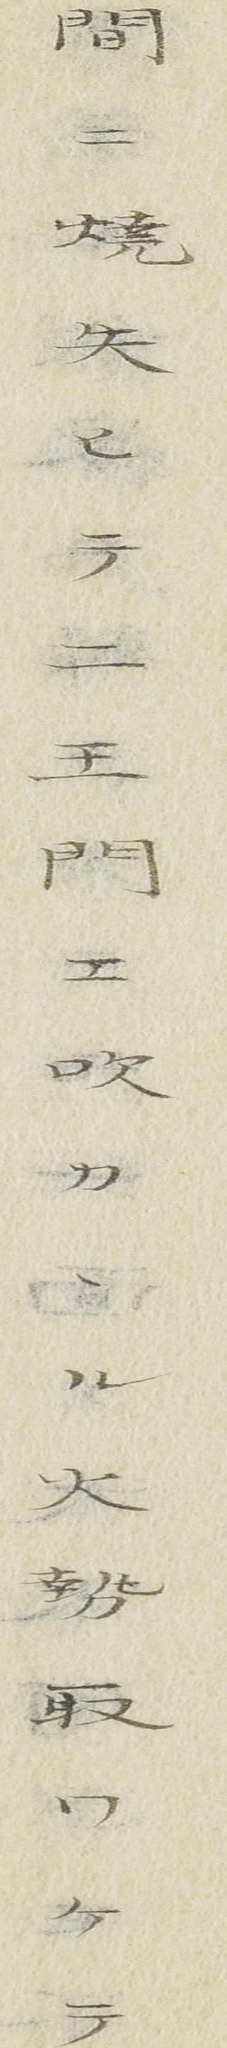間ニ焼失ヒテニ王門エ吹カヽル火勢取ワケテ
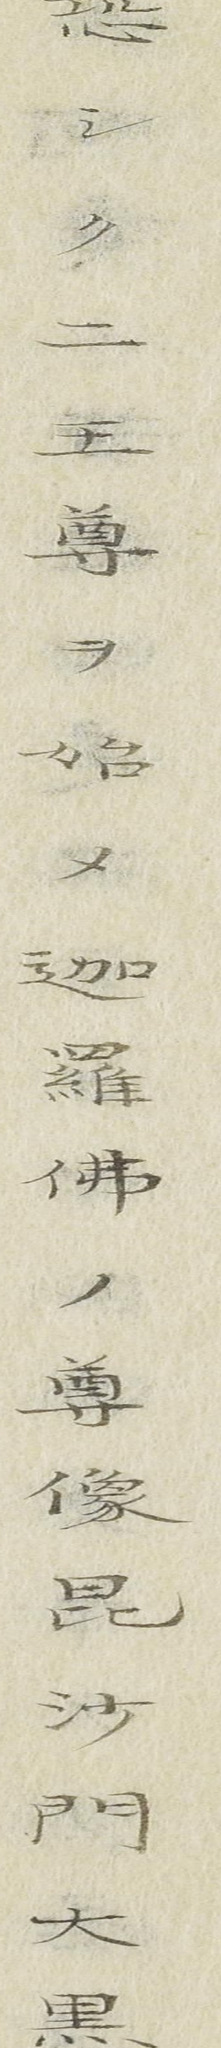恐シクニ王尊ヲ始メ迦羅仏ノ尊像毘沙門大黒
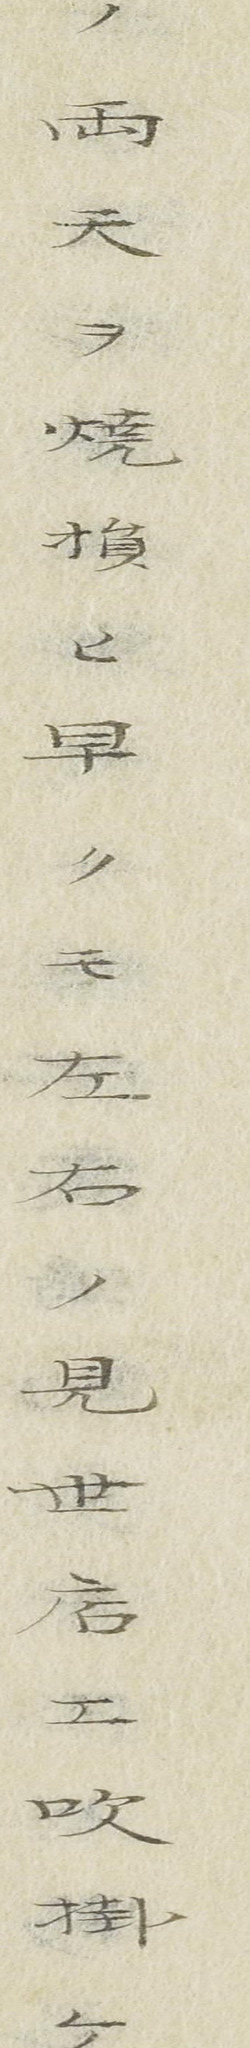ノ両天ヲ焼損ヒ早クモ左右ノ見世店エ吹掛ケ
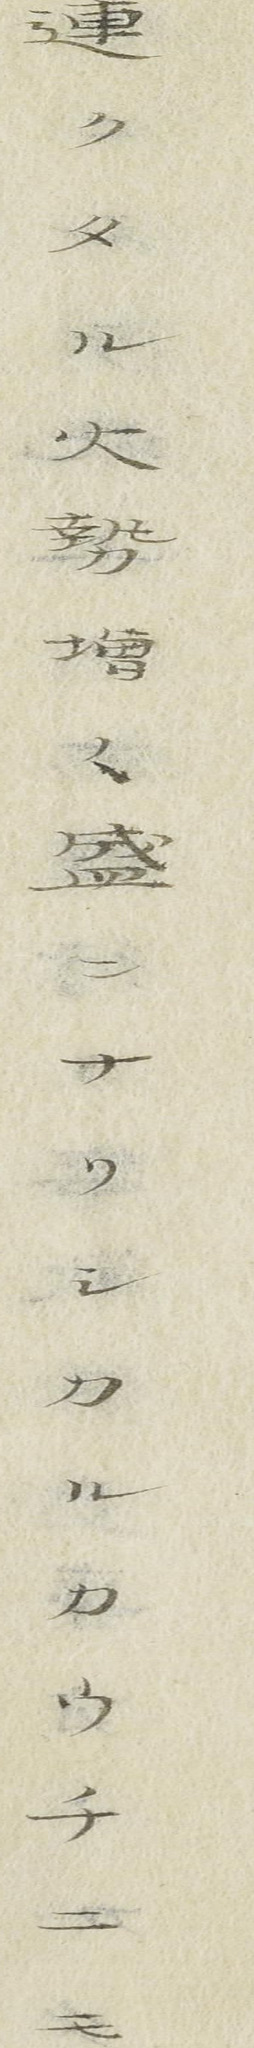連クタル火勢増〱盛ンナリシカルカウチニモ
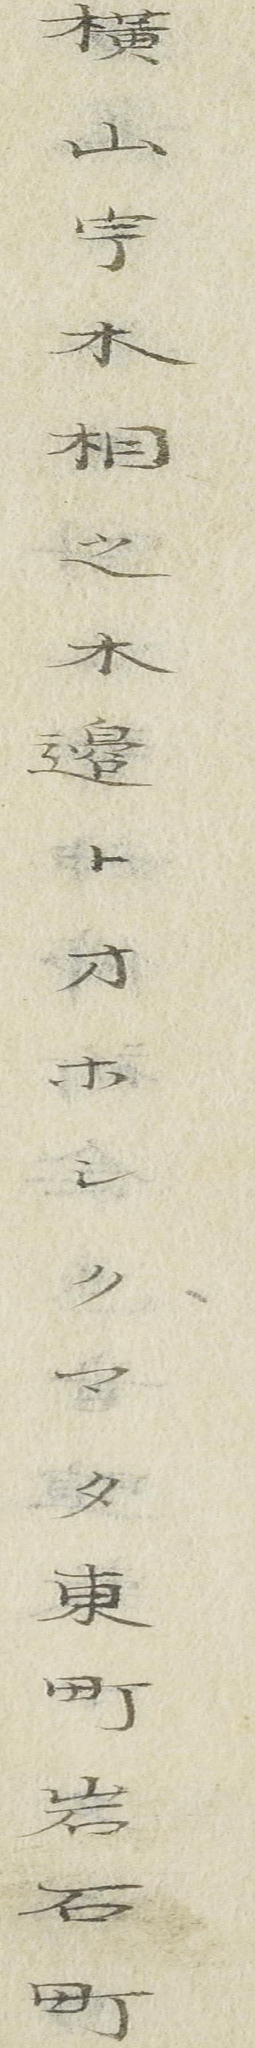横山宇木相之木辺トオホシクマタ東町岩石町
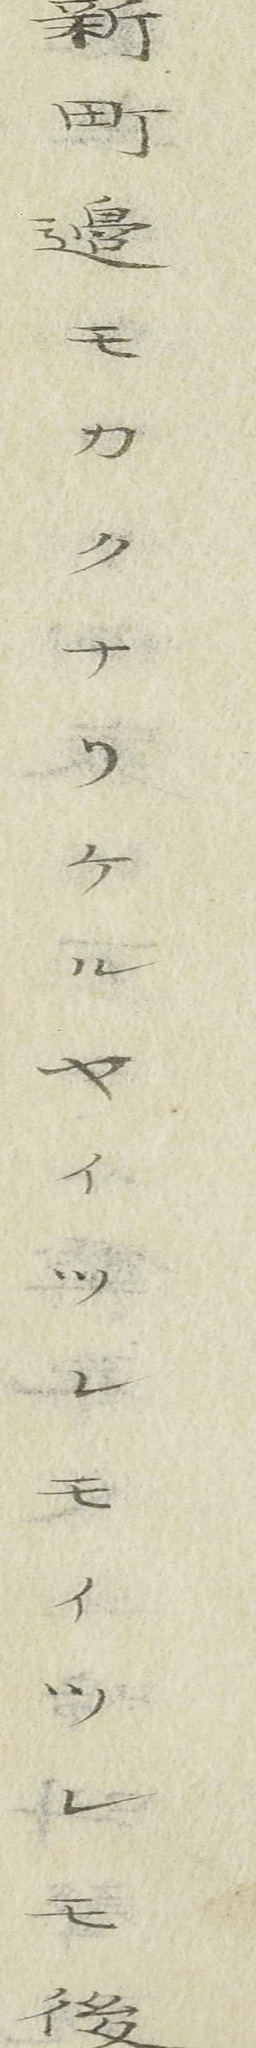新町辺モカクナリケルヤイツレモイツレモ後
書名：地災撮要　地震之部　巻ノ二
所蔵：東京大学地震研究所図書室 Earthquake Research Institute Library, The University of Tokyo, JAPAN
